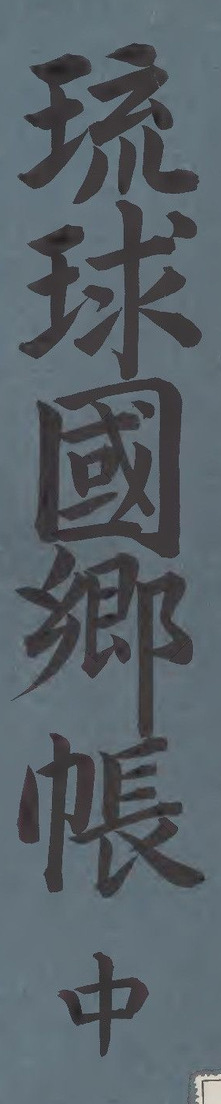琉球国郷帳中

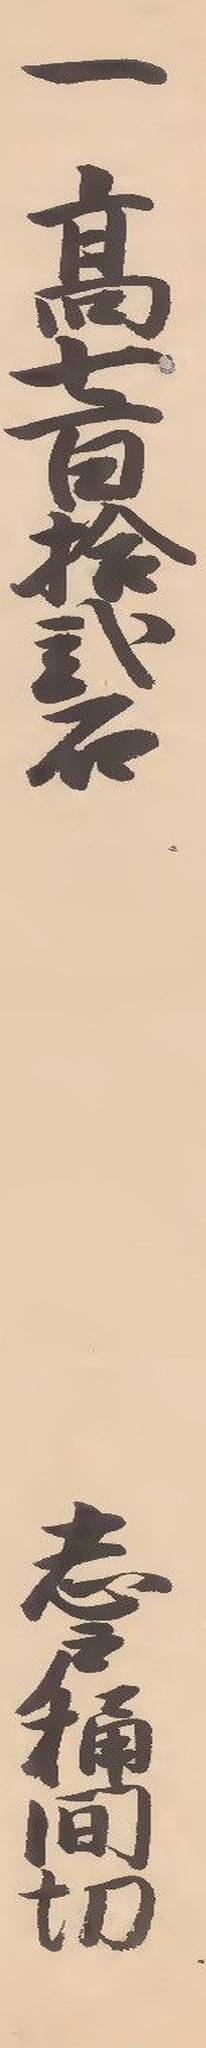一高七百拾弐石志戸桶間切
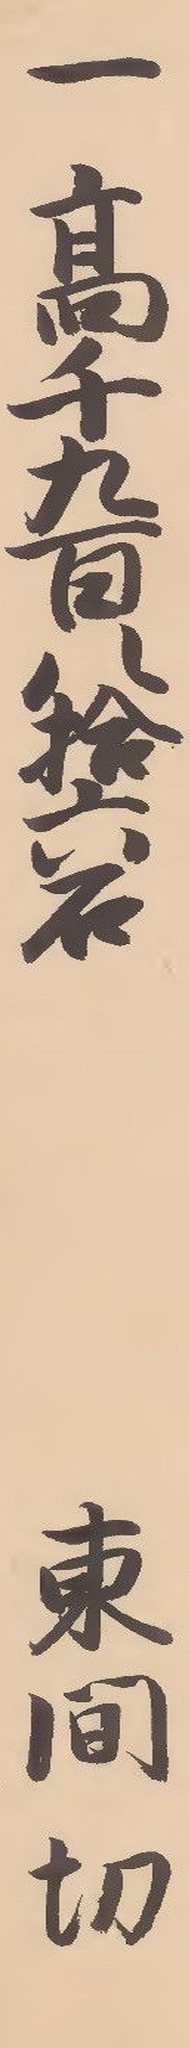一高千九百八拾六石東間切

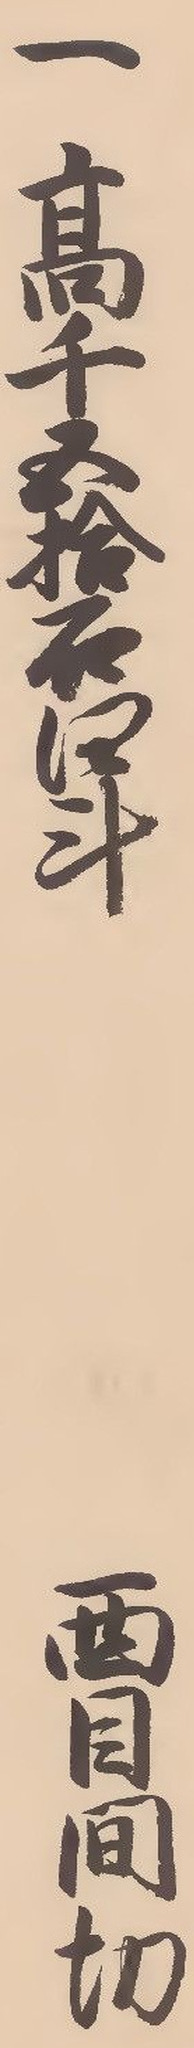一高千五拾石四斗西目間切
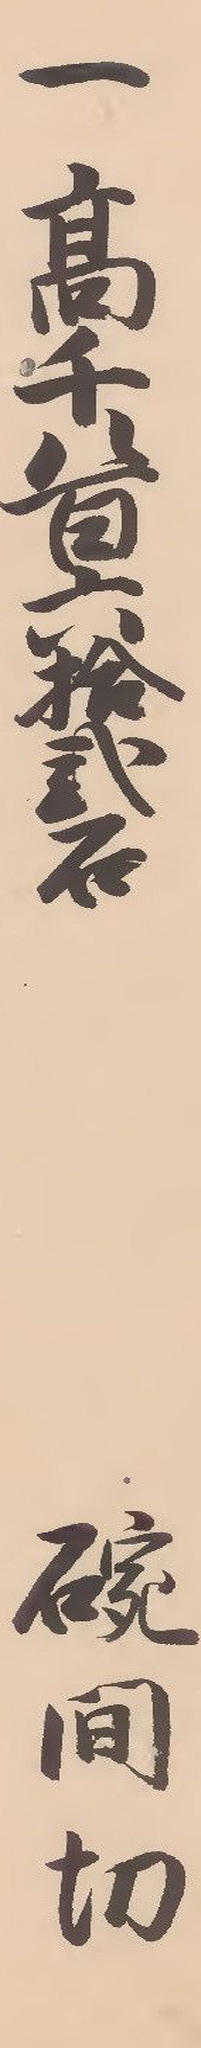一高千八百六拾弐石碗間切
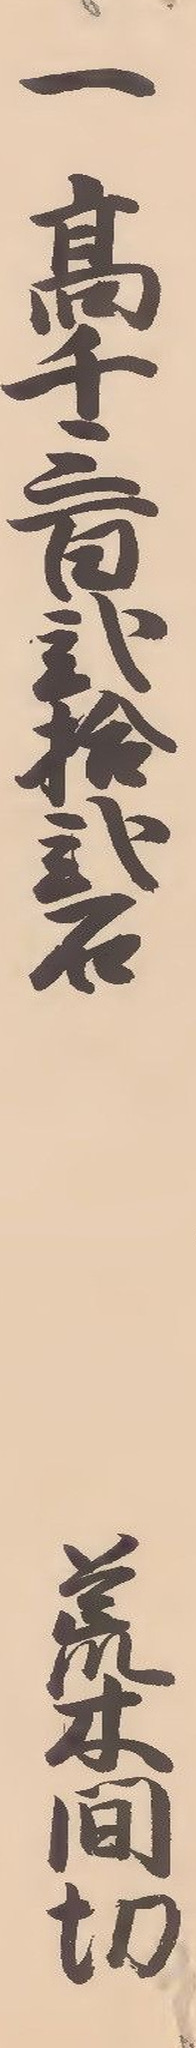一高千三百弐拾弐石荒木間切
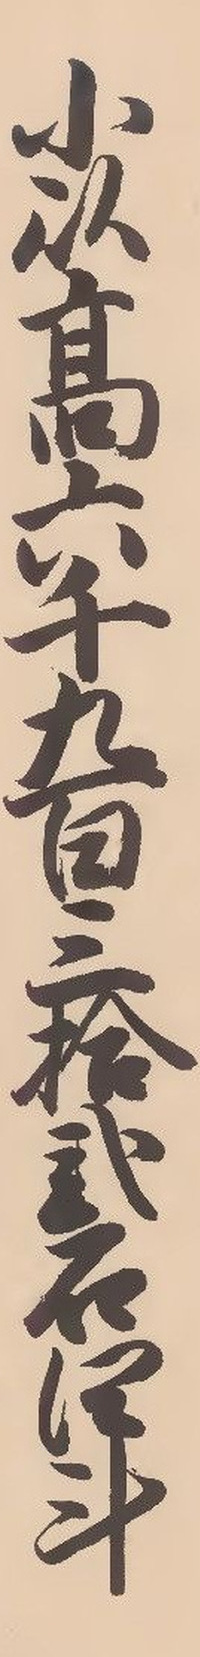小以高六千九百三拾弐石四斗
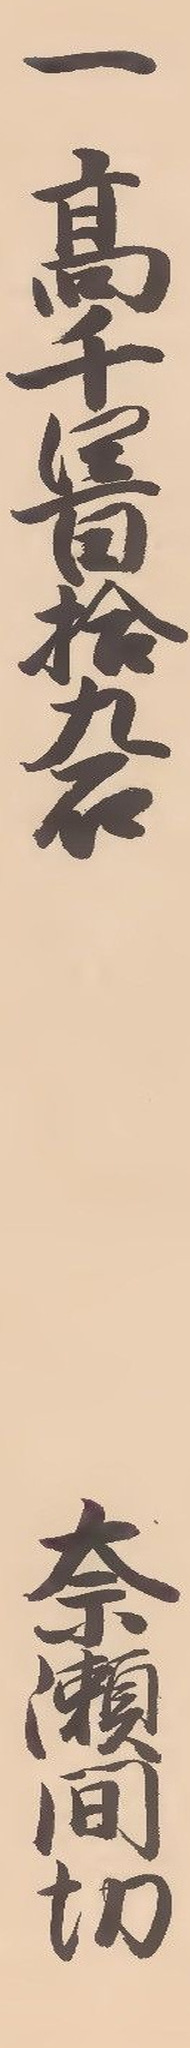一高千四百拾九石奈瀬間切

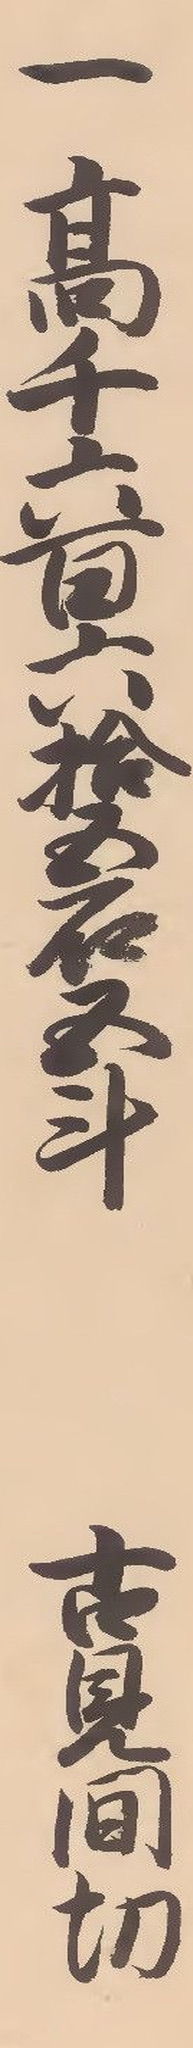一高千六百六拾五石五斗古見間切
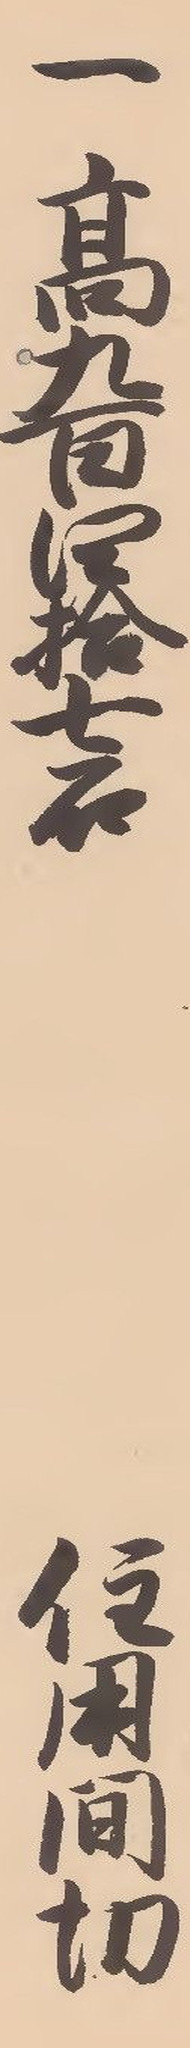一高九百四拾七石住用間切
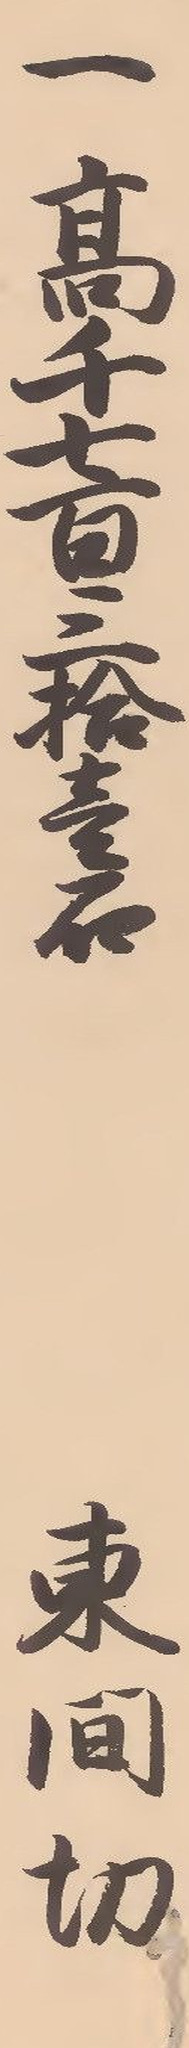一高千七百三拾壱石東間切
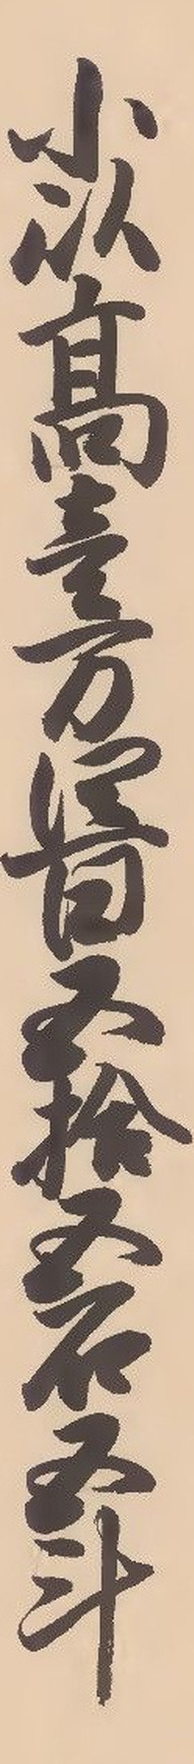小以高壱万四百五拾五石五斗

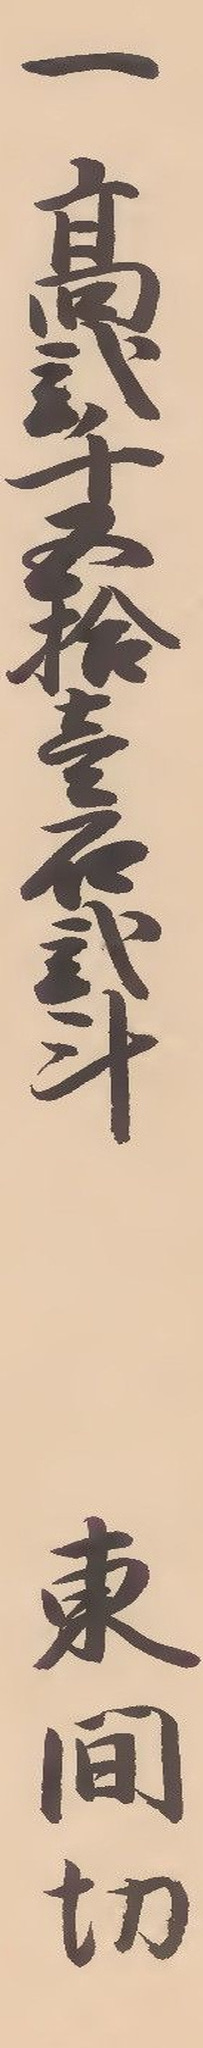一高弐千五拾壱石弐斗東間切
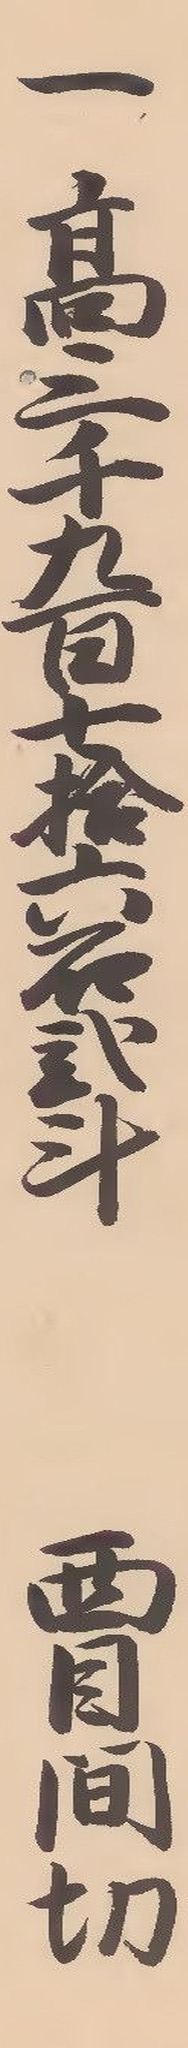一高三千九百七拾六石弐斗西目間切
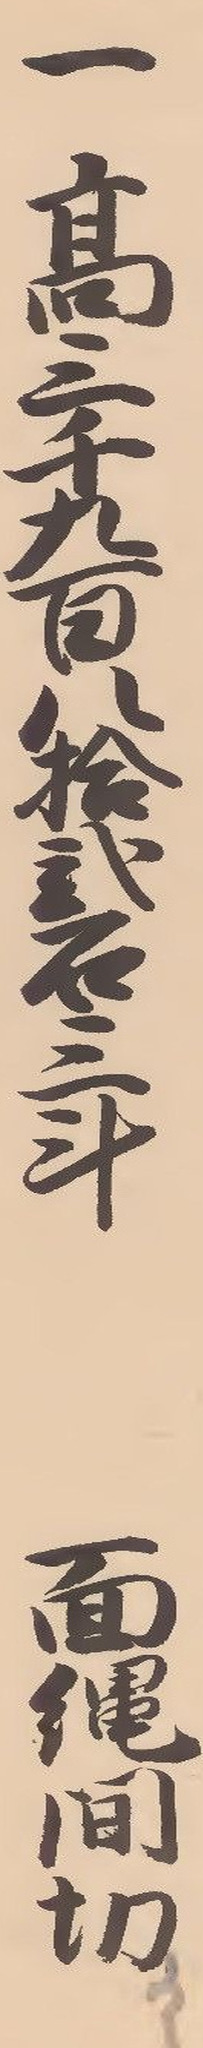一高三千九百八拾弐石三斗面縄間切
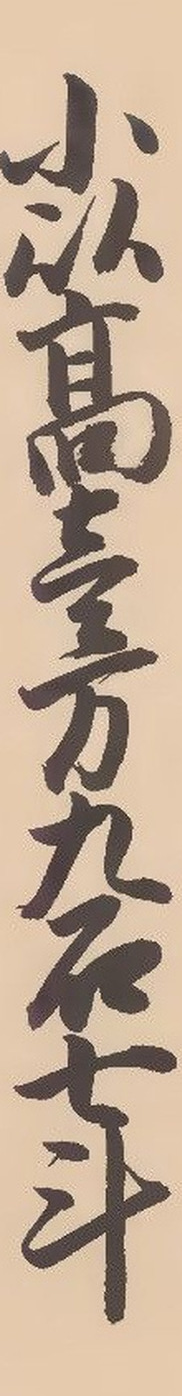小以高壱万九石七斗
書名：琉球国郷帳　中
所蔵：国立公文書館 National Archives of Japan
